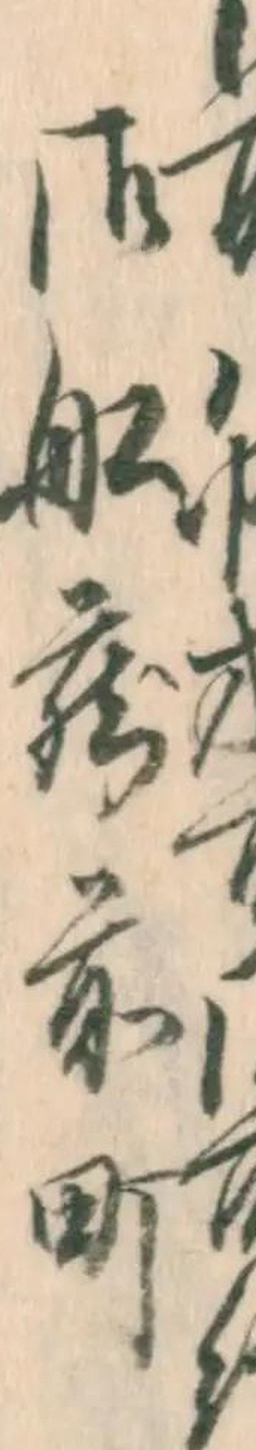御船蔵前町
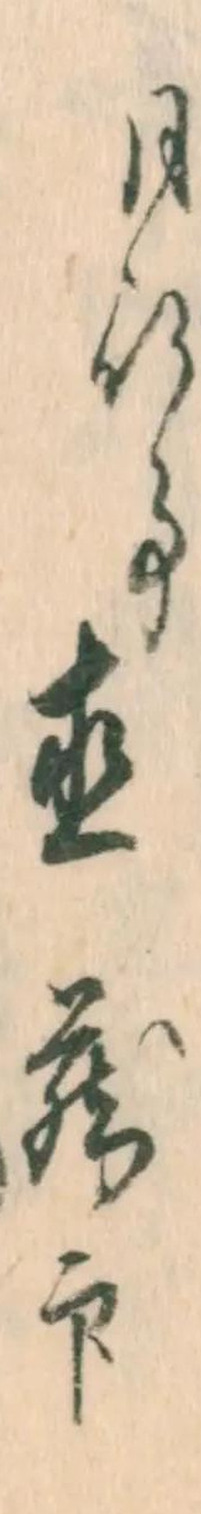月行事直蔵印
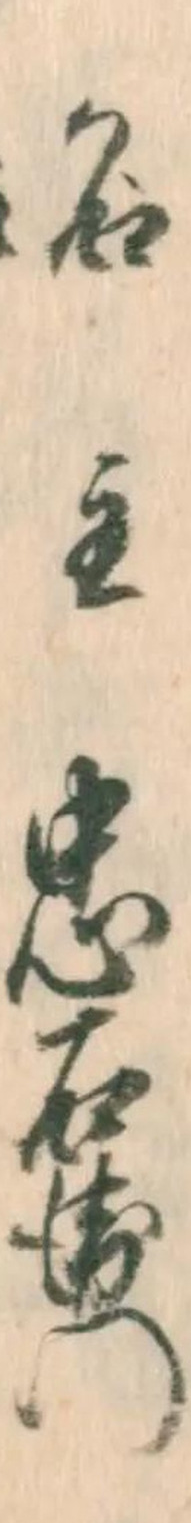名主忠右衛門
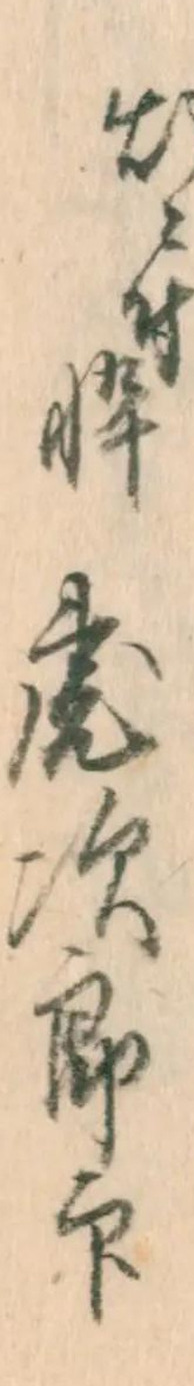煩ニ付倅虎次郎印
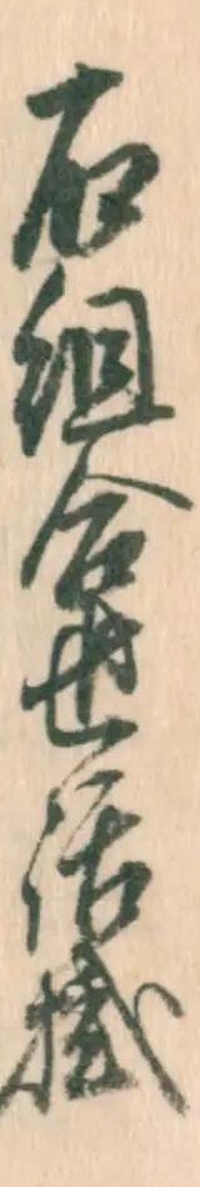右組合世話掛
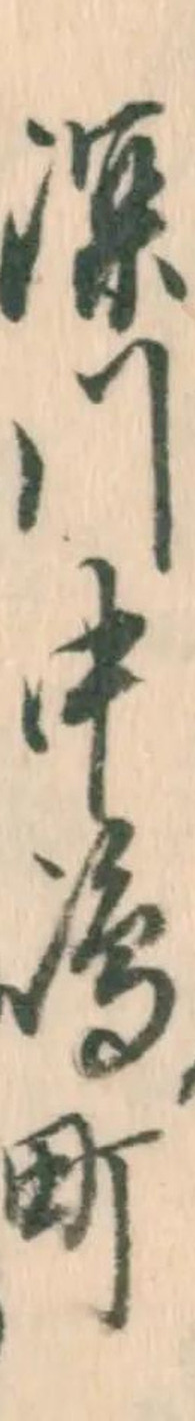深川中島町
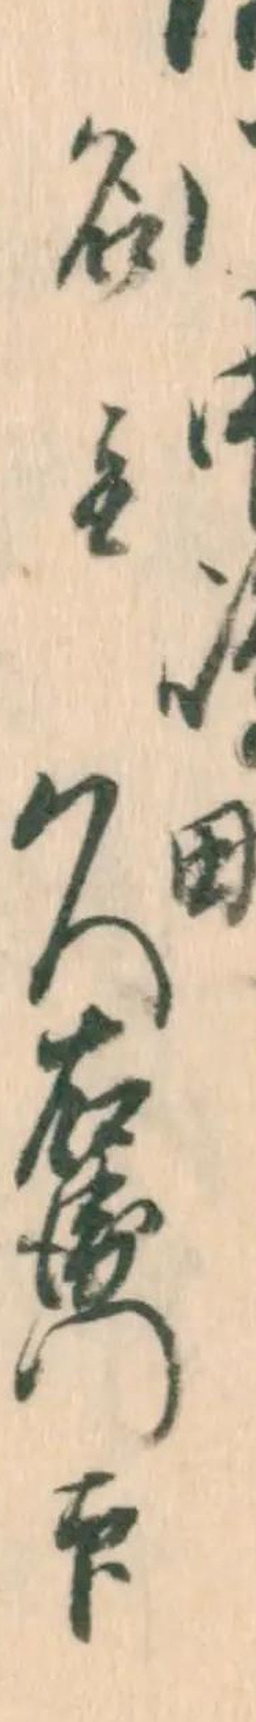名主八左衛門印
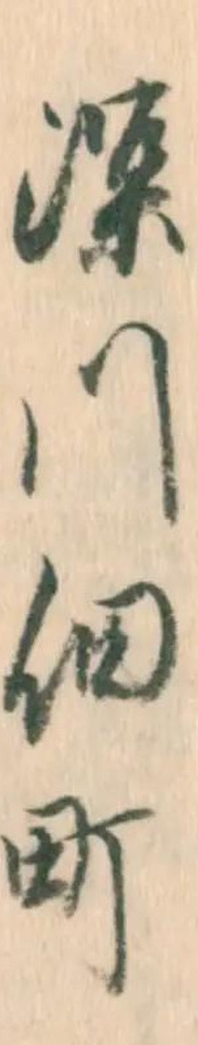深川佃町
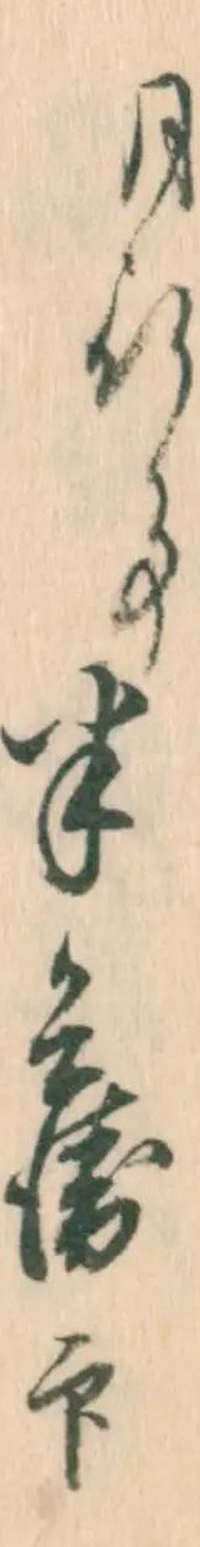月行事半兵衛印
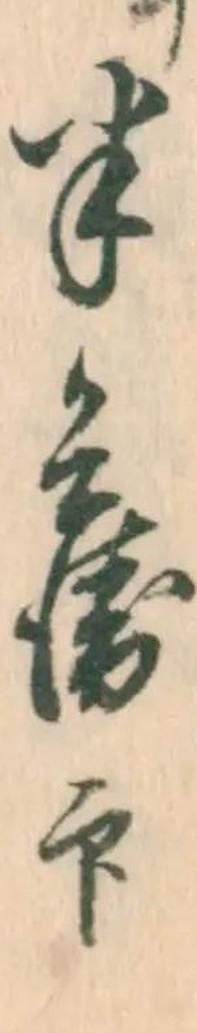月行事半兵衛印
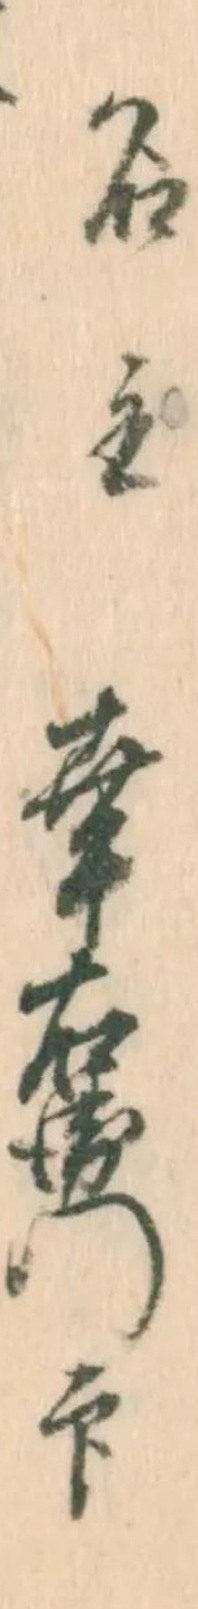名主幸右衛門印
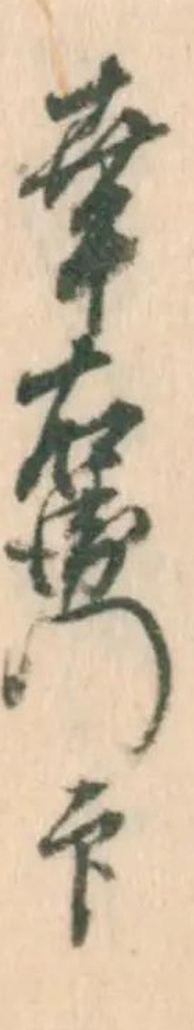名主幸右衛門印
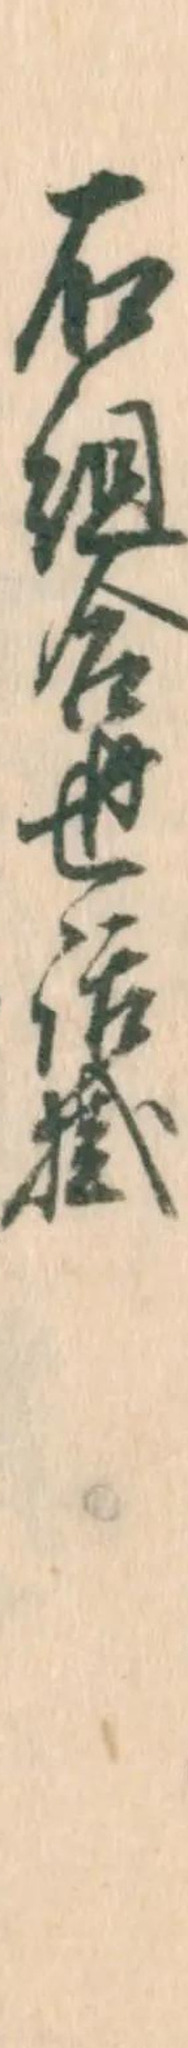右組合世話掛
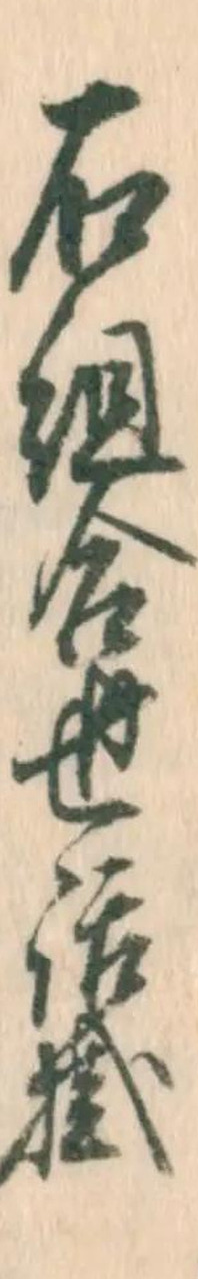右組合世話掛
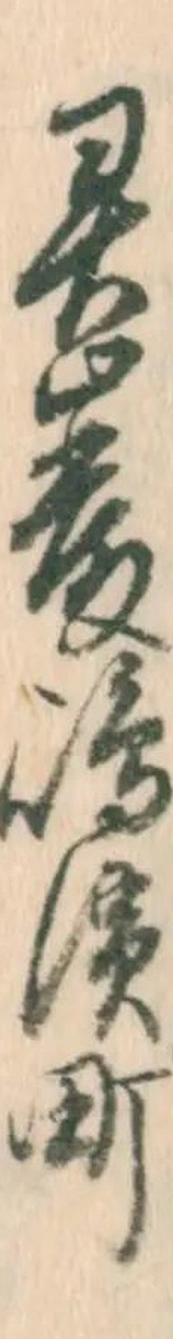霊厳島浜町
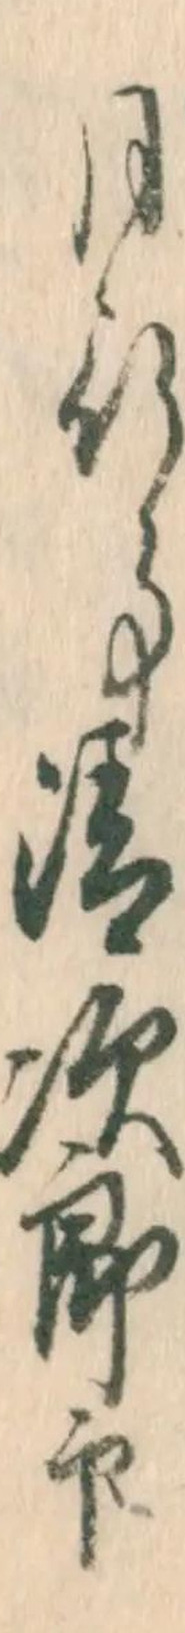月行事清次郎印
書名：地震災書留 2巻. [2] 内表紙に「地震一件　安政二卯年十月」とあり
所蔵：国立国会図書館 National Diet Library, JAPAN
